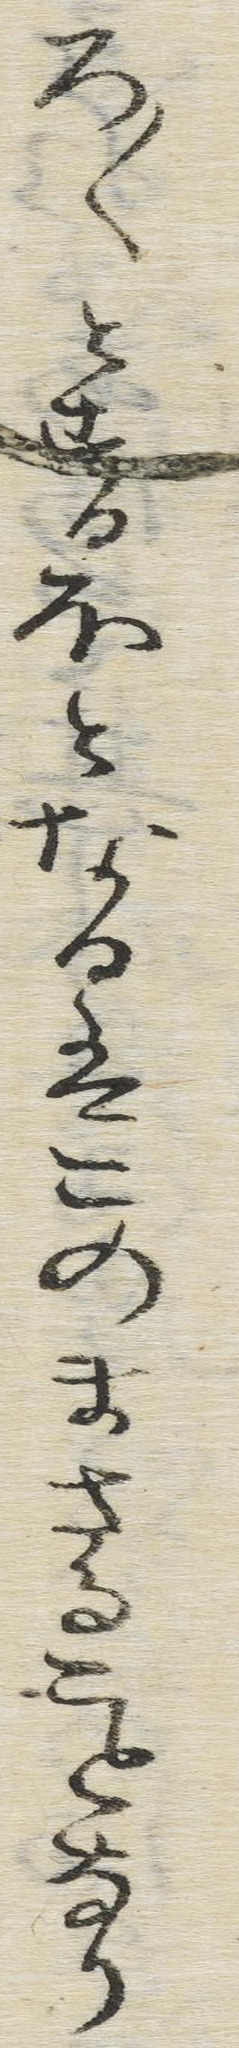ろ〳〵とするほとなるはこのまさることなり
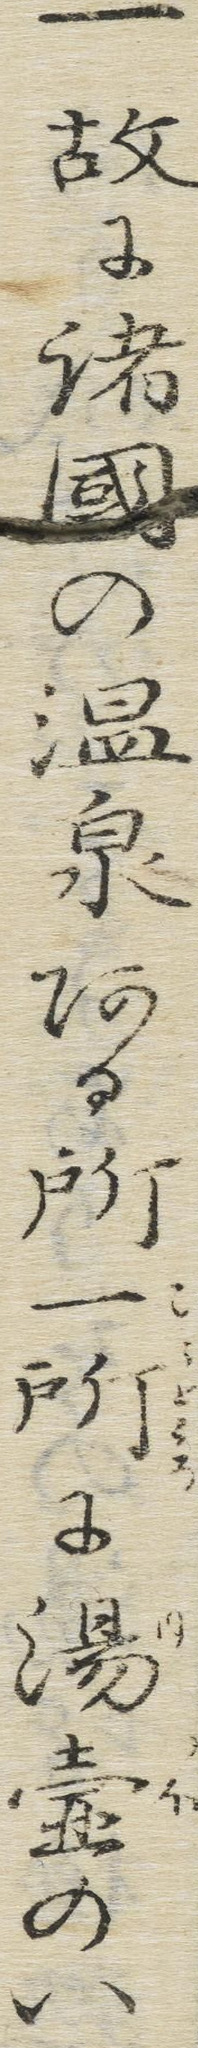一故に諸国の温泉ある所一所に湯壺のい
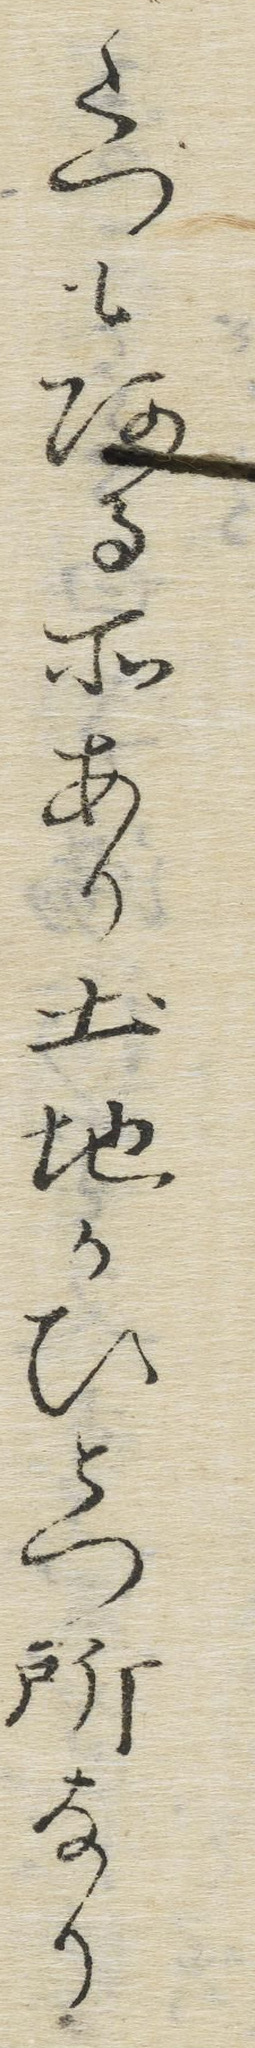くつもある所あり土地にひとつ所なり
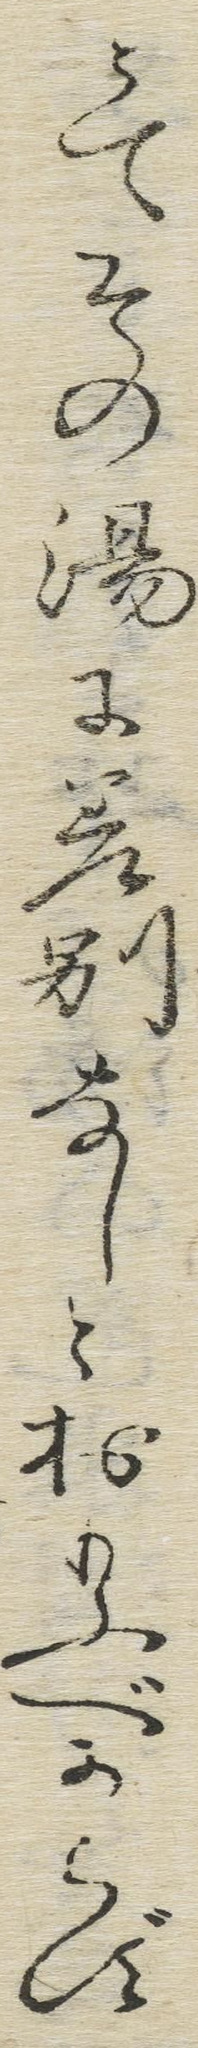とてその湯に差別なしとおもふべからず
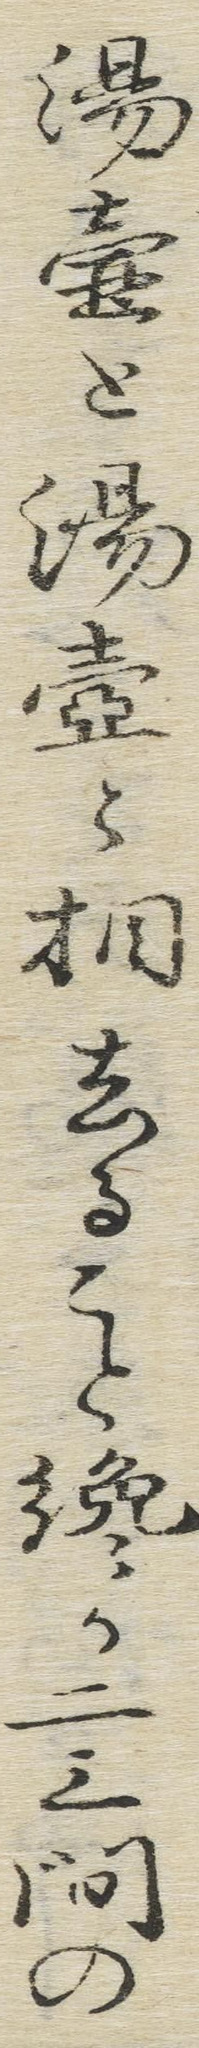湯壺と湯壺と相去ること纔か二三間の
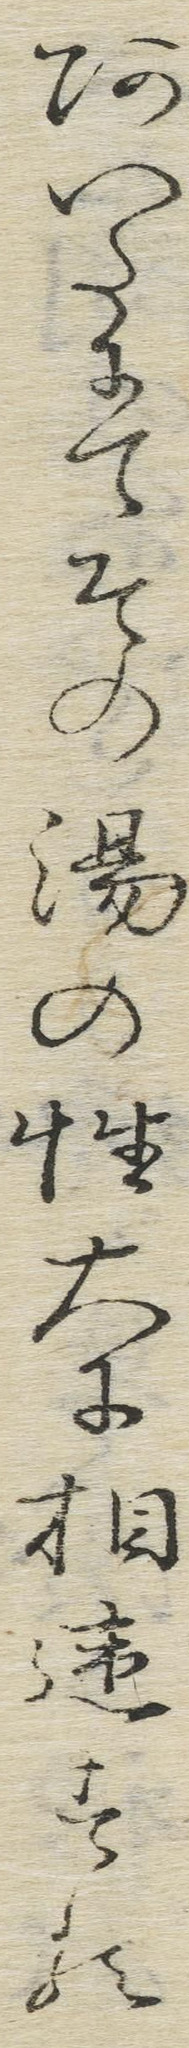あいたにてその湯の性大に相違する
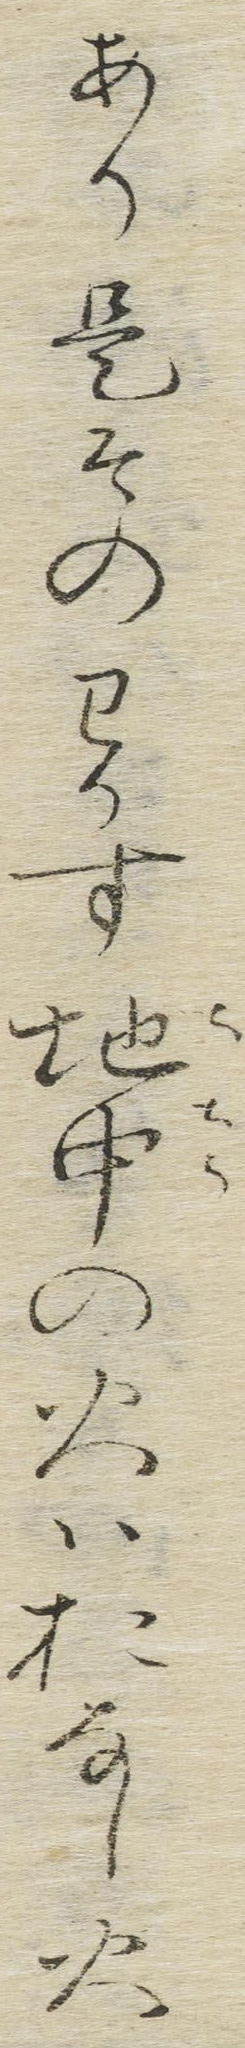あり是そのわかす地中の火はおなし火
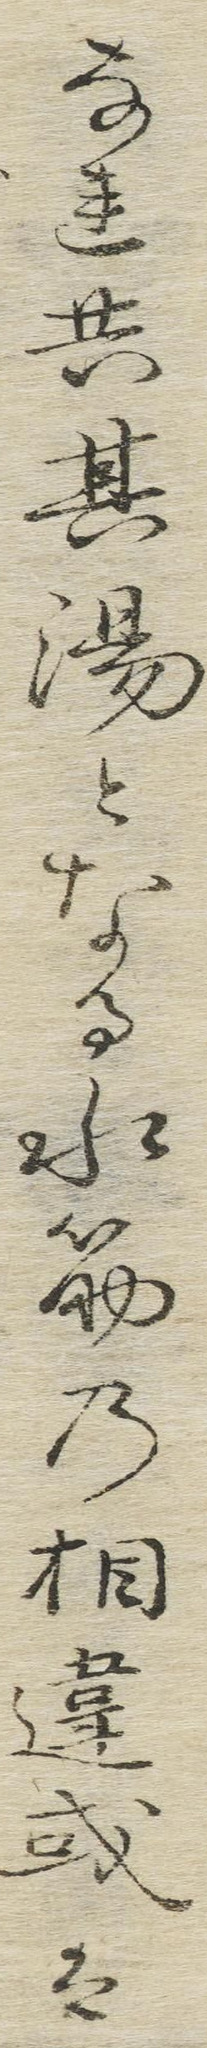なれ共其湯となる水筋の相違或は
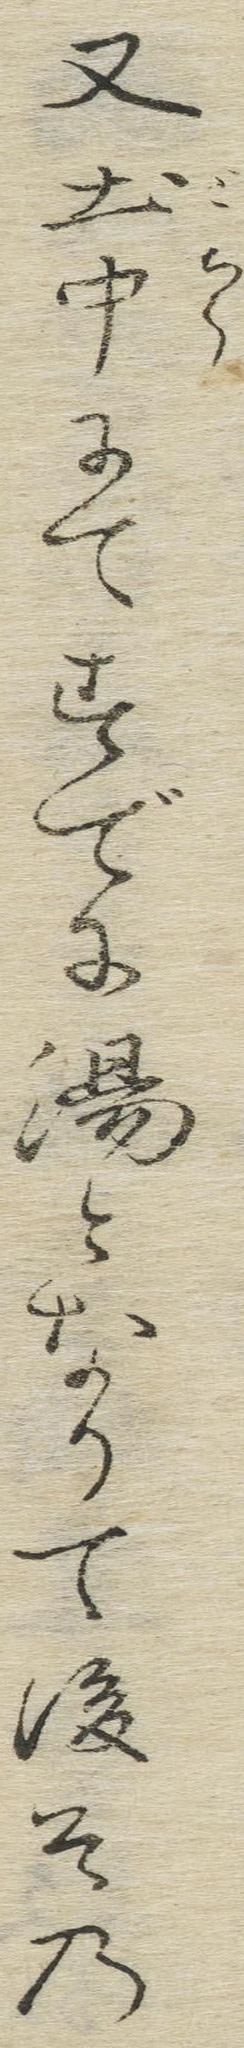又土中にてすでに湯となりて後その

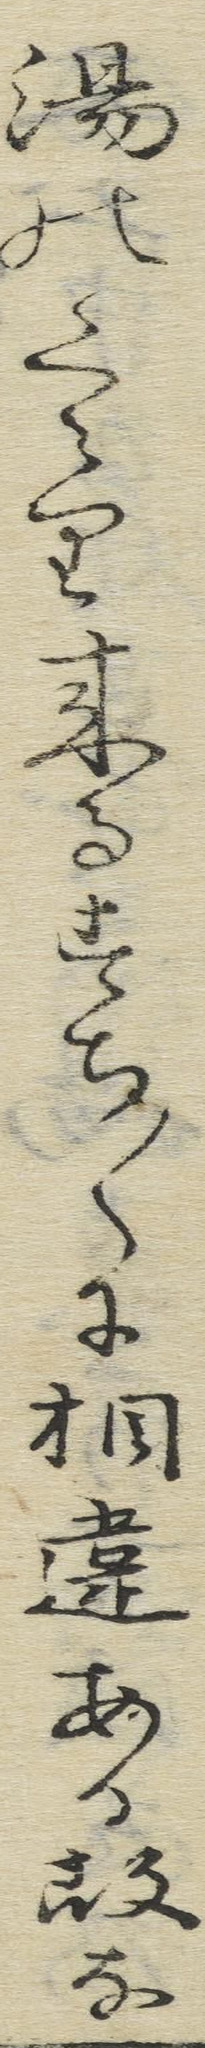湯のくたり来るすち〳〵に相違ある故な
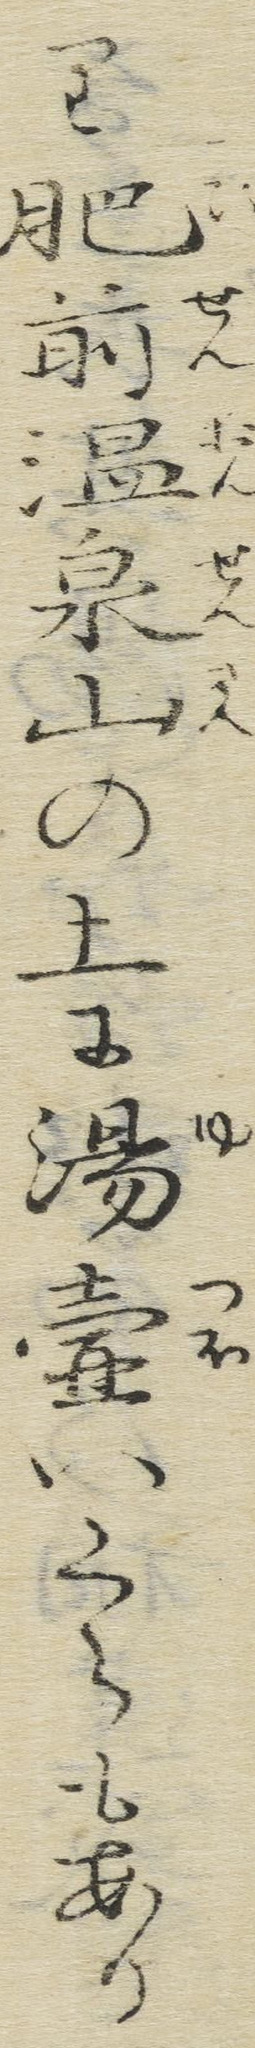り肥前温泉山の上に湯壺いくらもあり
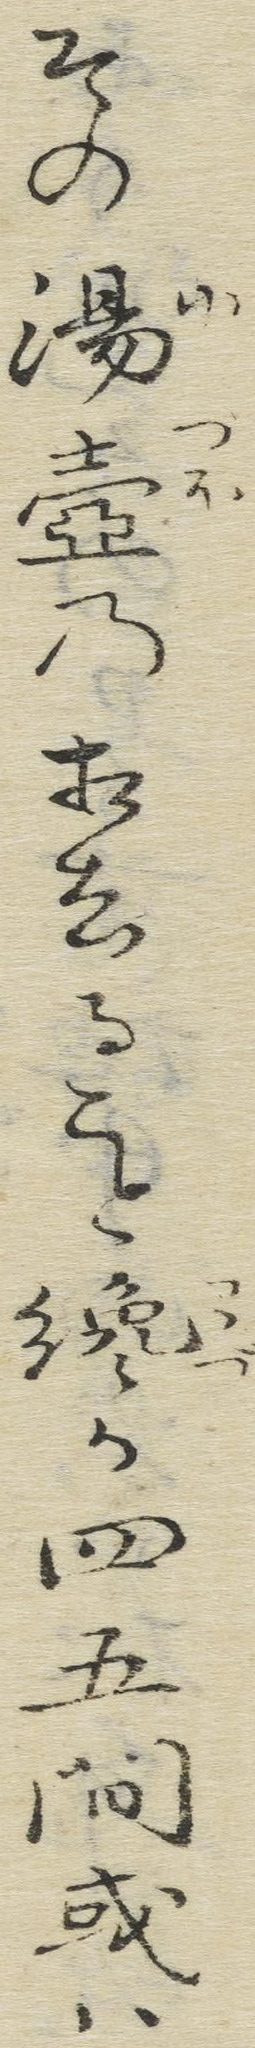その湯壺の相去ること纔か四五間或は
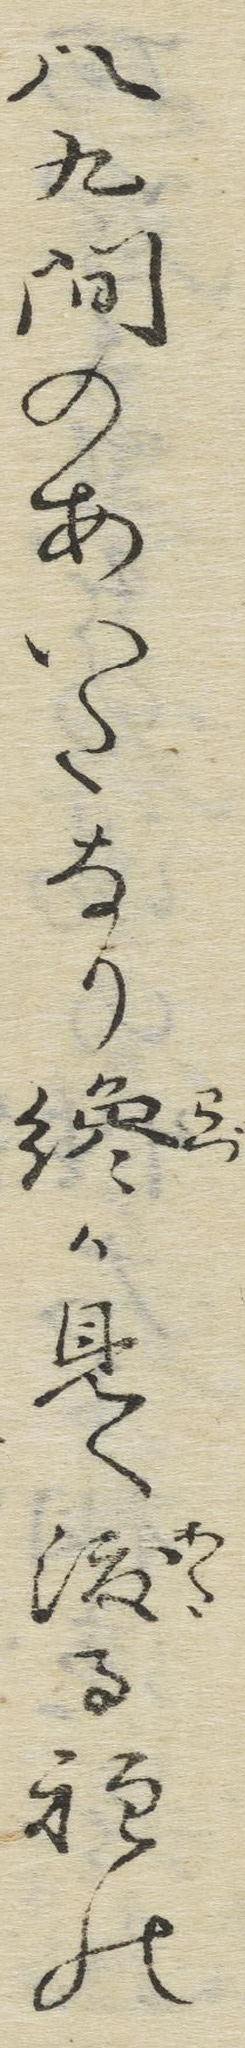八九間のあいたなり纔か見へ渡る程の
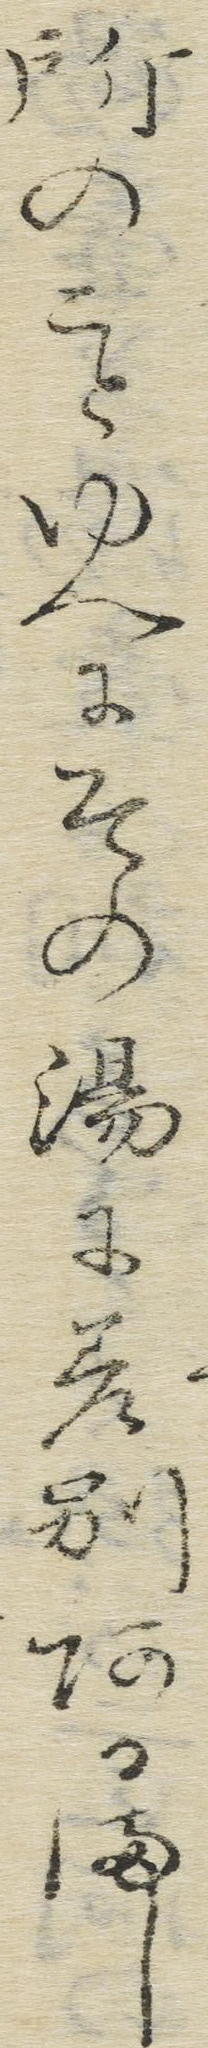所のことゆえにその湯に差別あるまし
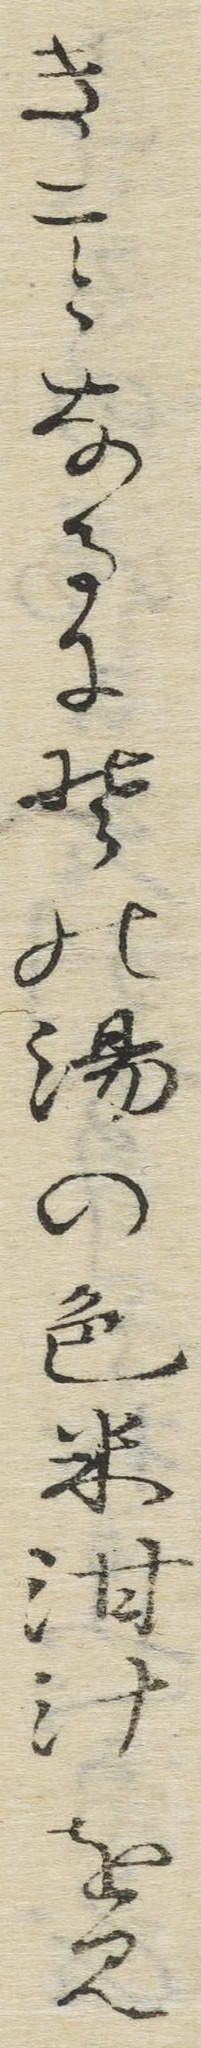きことなるにその湯の色米泔汁を見
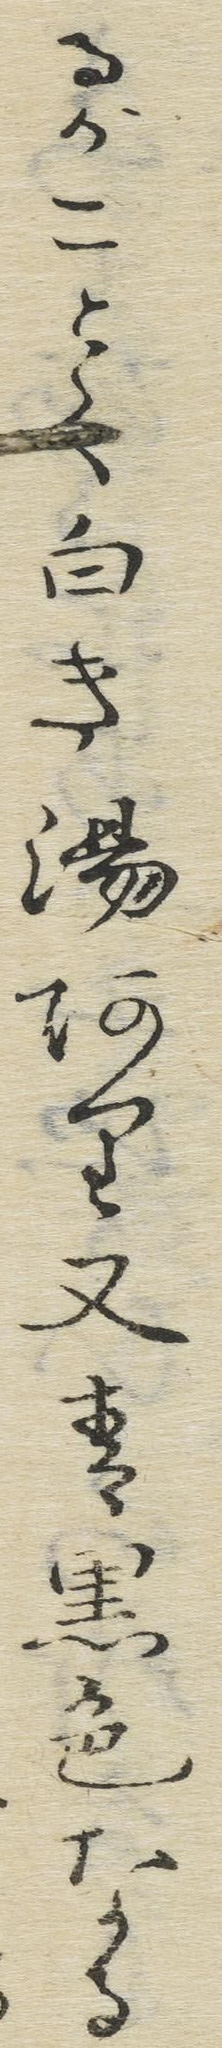るかことく白き湯あり又青黒色なる
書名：温泉考
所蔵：東京大学地震研究所図書室 Earthquake Research Institute Library, The University of Tokyo, JAPAN
